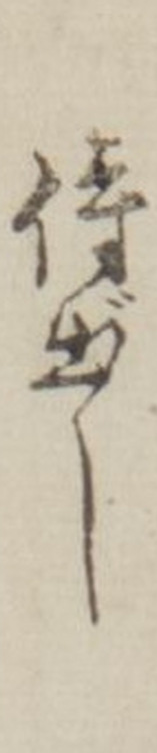侍出し
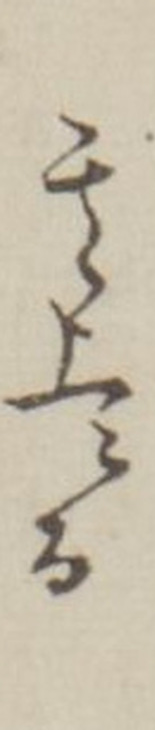其上に而
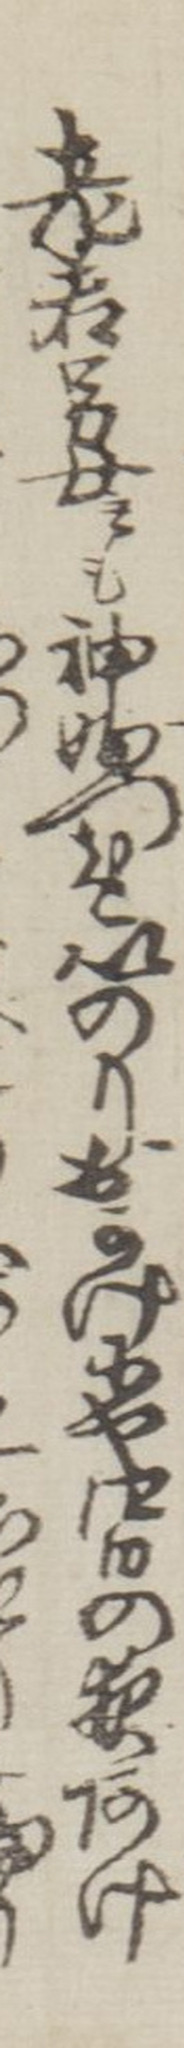老若男女とも神ふつをいのりおかけにや四日の夜あけ
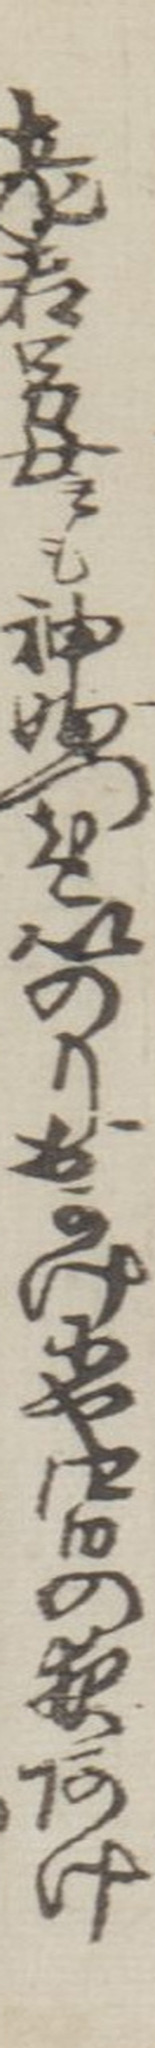老若男女とも神ふつをいのりおかけにや四日の夜あけ
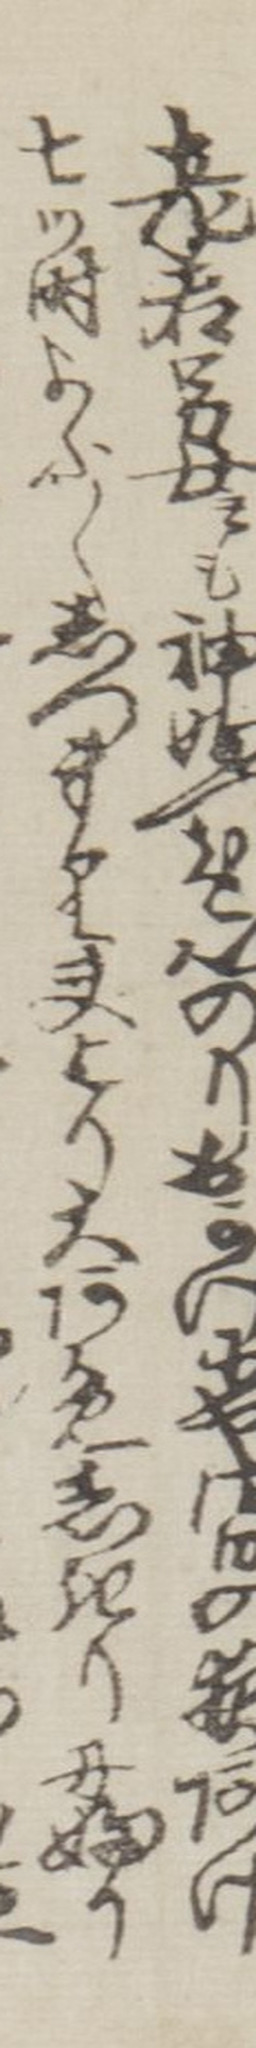七ツ時よふ〳〵しつまり夫より大あめしきりにふり
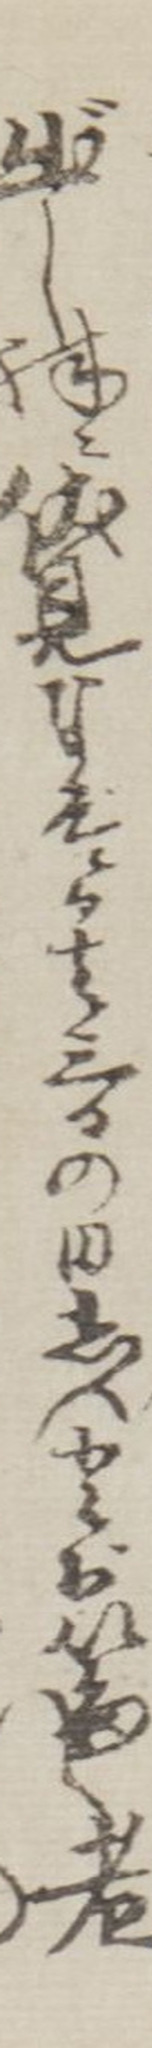出し殊に伏見なとに而は三日の内しんとおいたし老
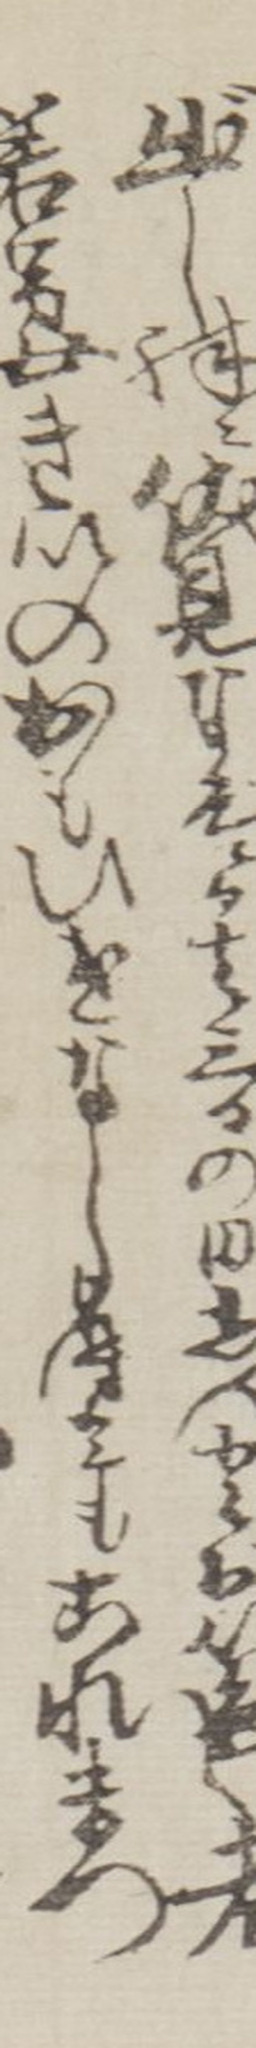若男女きいのおもひをなし候得ともこれまつ
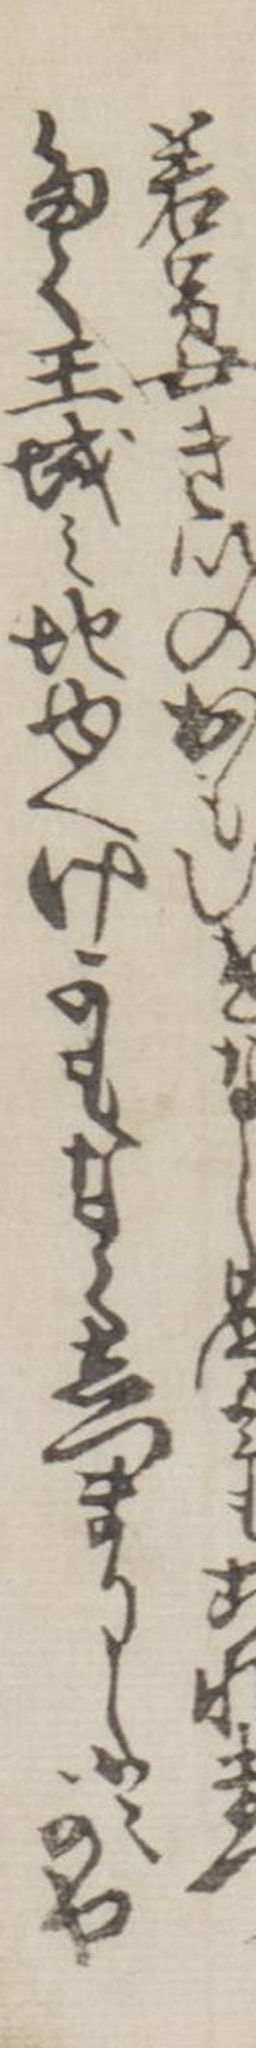たく王城之地ゆへけかもなくしつまりしにとかや
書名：京大坂伏見大地震
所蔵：あいおいニッセイ同和損保株式会社
